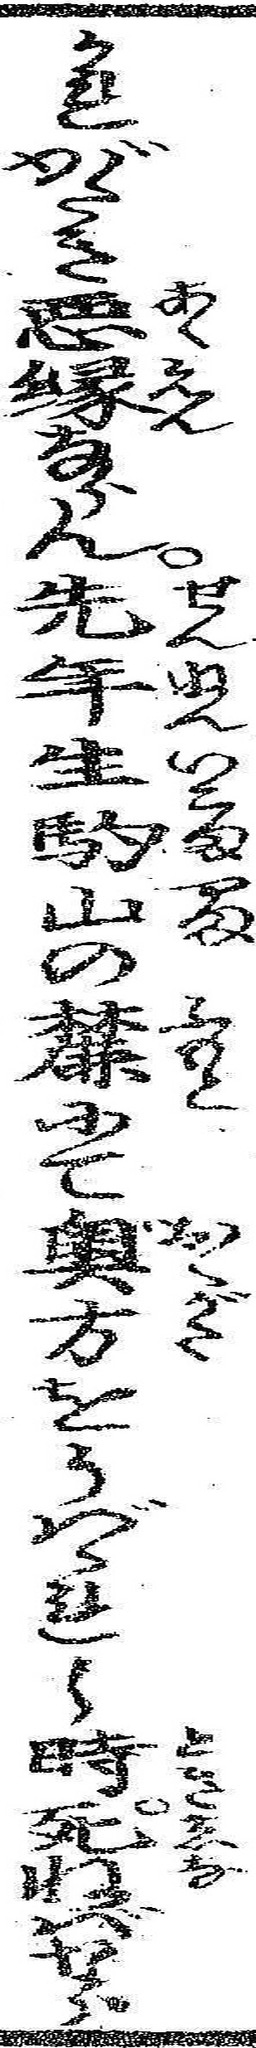かれがたき悪縁ならん。先年生駒山の麓にて奥方をうばゝれし時。死ねばなら
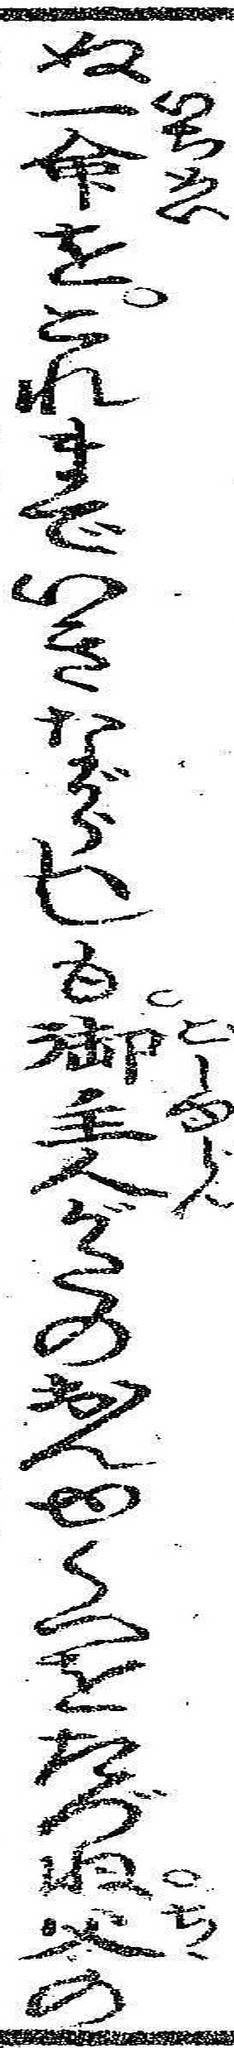ぬ一命を。これまでいきながらへしも。御主人がたのおんゆくへをたづね。父の
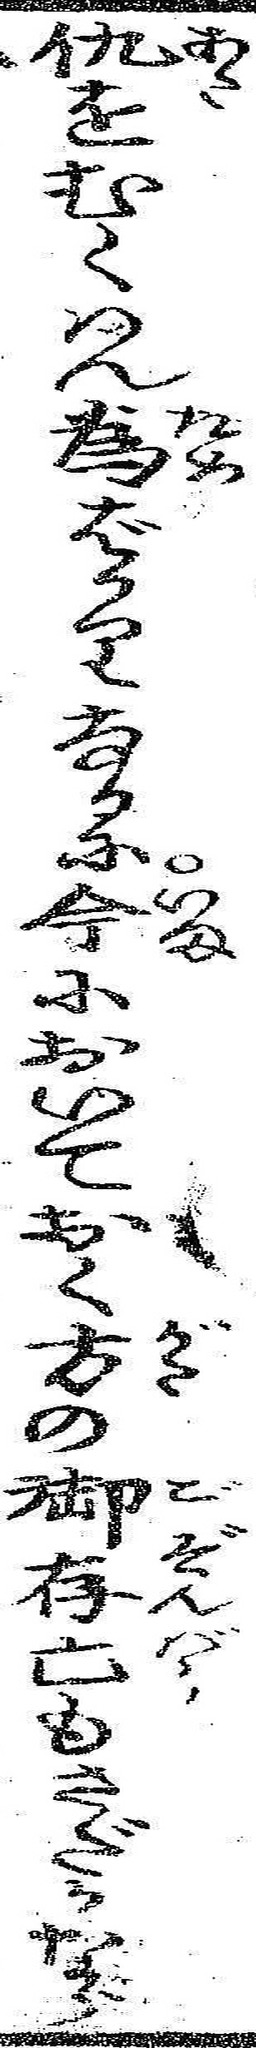仇をむくはん為ばかりなるに。今においておく方の御存亡もさだかなら
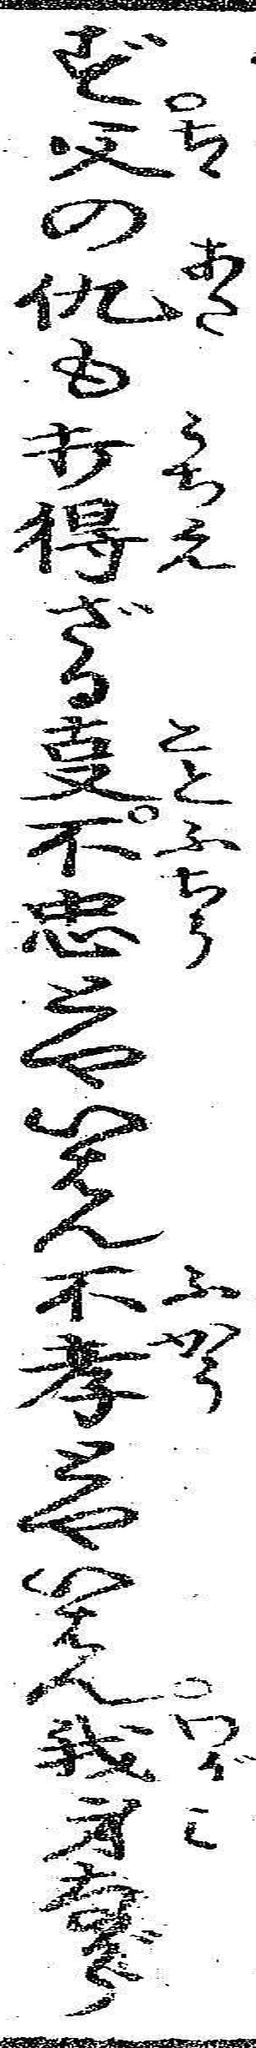ず。父の仇も打得ざる事。不忠とやいはん不孝とやいはん。我身ながら

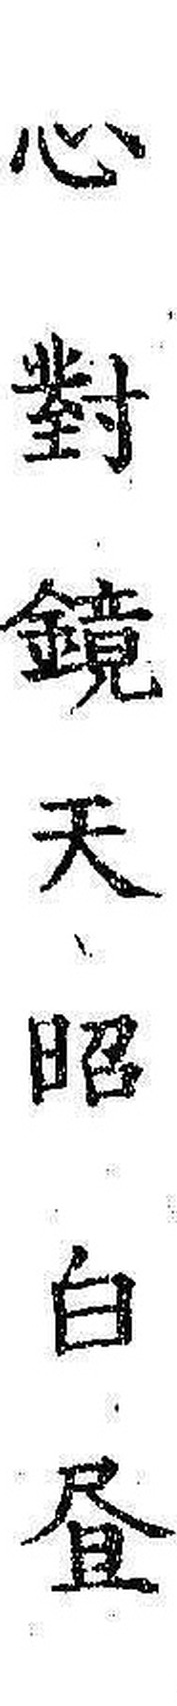心対鏡天昭白昼
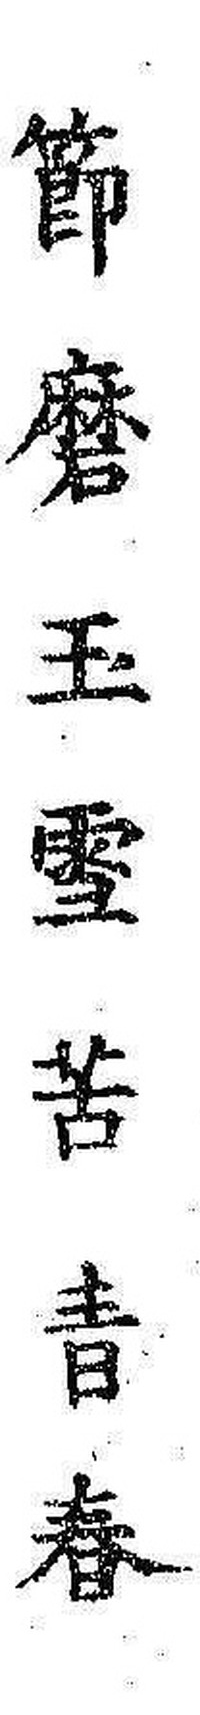節磨玉雪苦青春
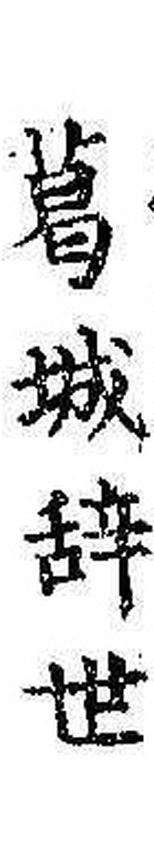葛城辞世
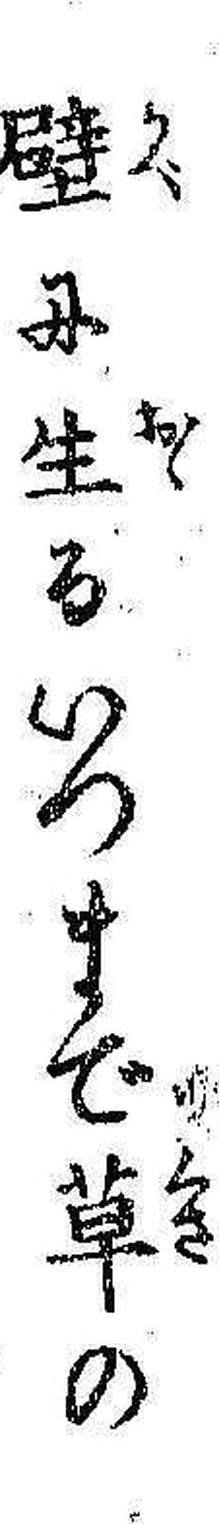壁に生るいつまで草の
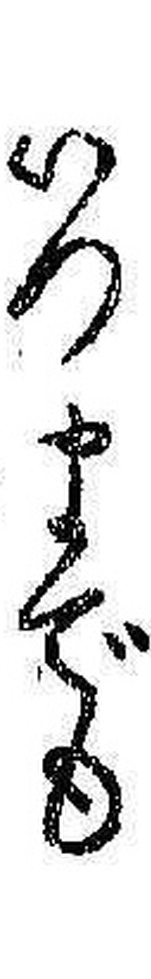いつまでも
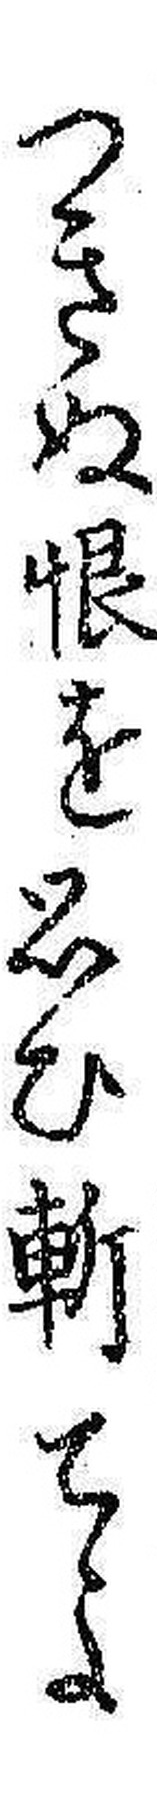つきぬ恨を思ひ斬てよ
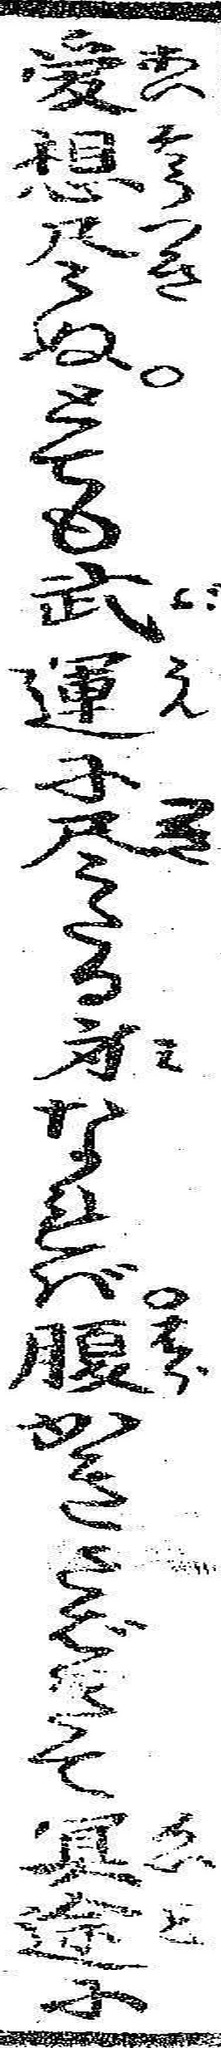愛想尽ぬ。とても武運に尽たる身なれば。腹かきさばきて冥途に
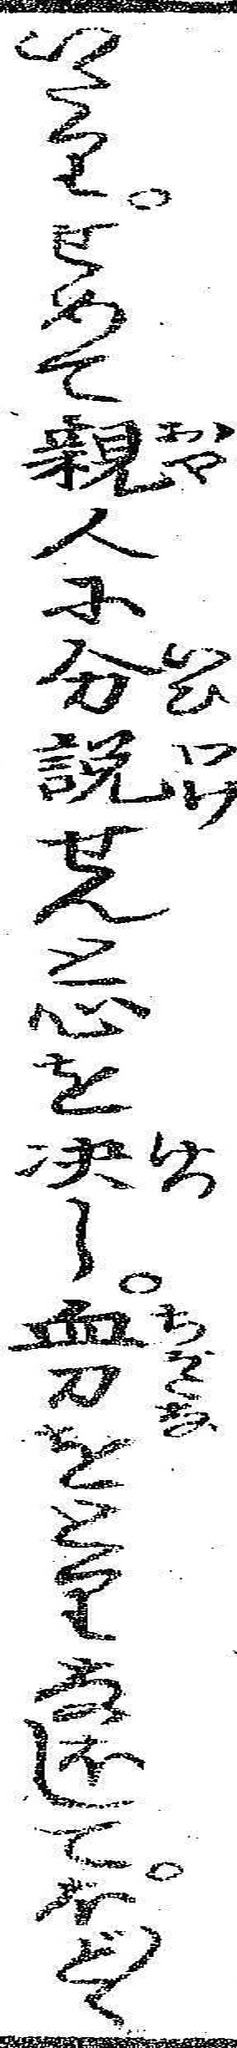いたり。せめて親人に分説せんと心を決し。血刀をとりなほして。ほど〳〵
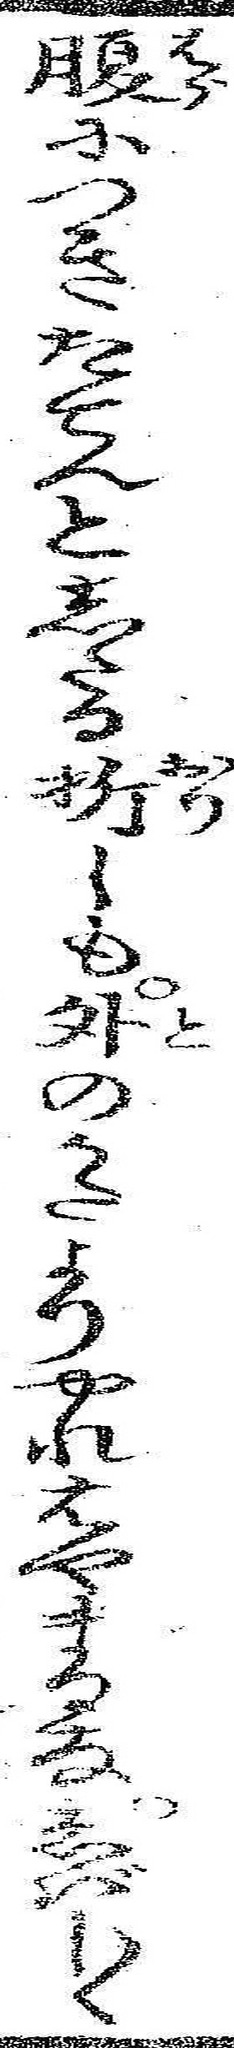腹につきたてんとしたる折しも。外のかたよりやれはやまるな。しばし〳〵
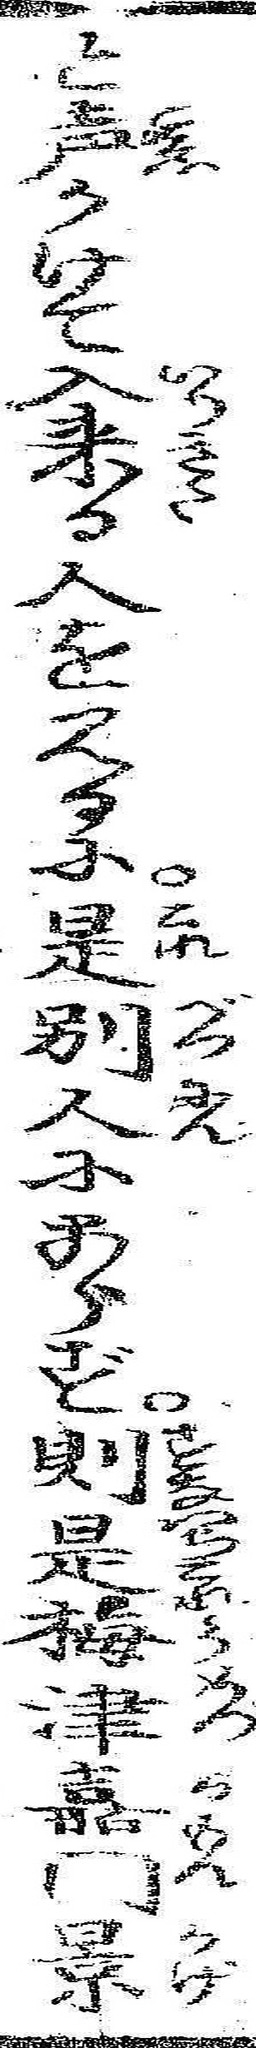と声かけて入来る人を見るに。是別人にあらず。則是梅津嘉門景
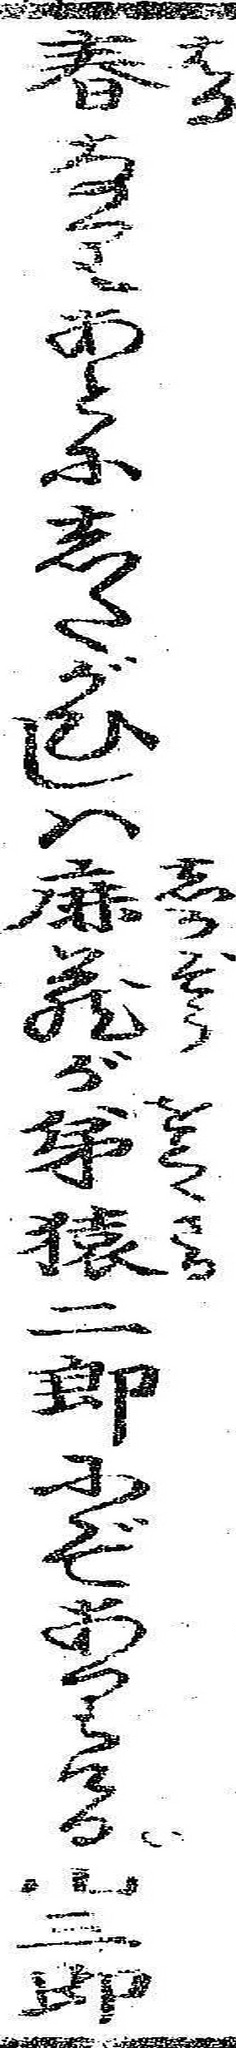春なりあとにしたがひしは鹿蔵が弟猿二郎にぞありける。山三郎
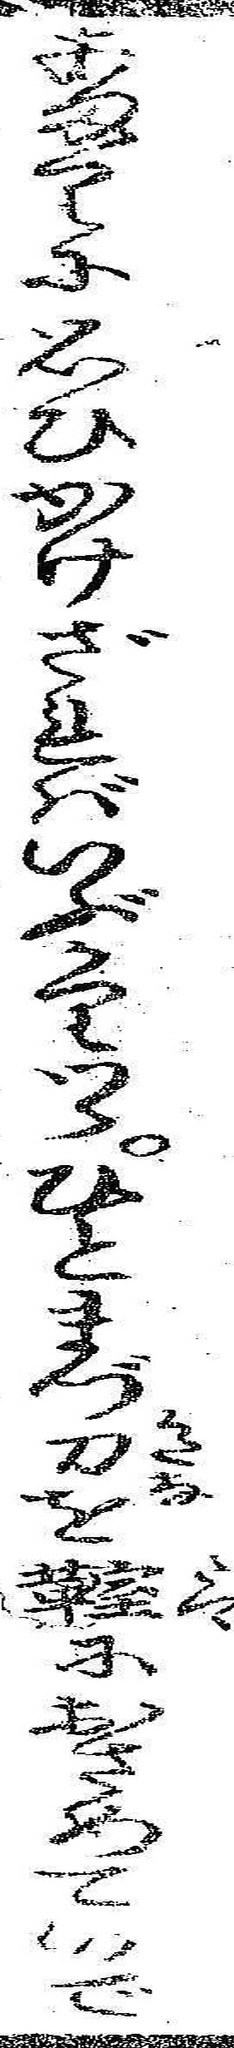あまりに思ひかけざればいぶかりつゝ。ひとまづ刀をにおさめていで
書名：昔話稲妻表紙
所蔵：国文学研究資料館
